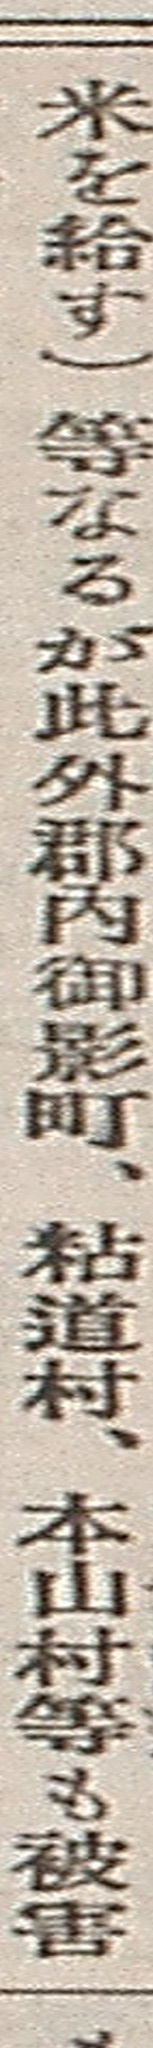米を給す）等なるが此外郡内御影町、粘道村、本山村等も被害
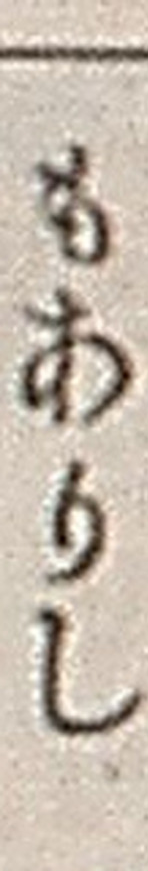もありし
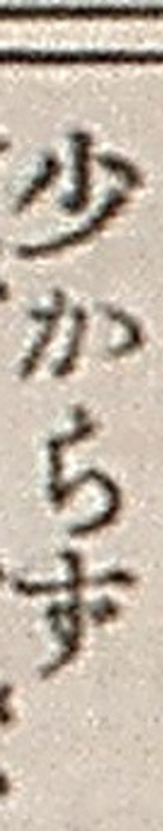少からず
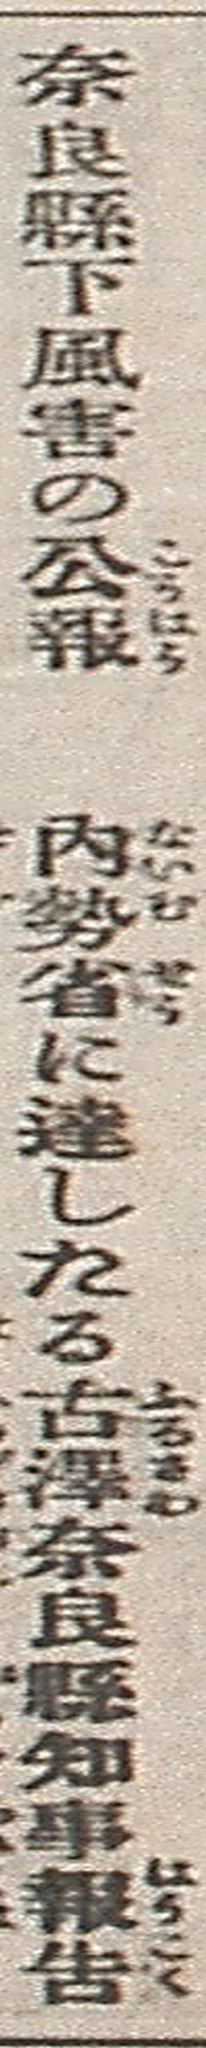奈良県下の風害の公報内務省に達したる古沢奈良県知事報告
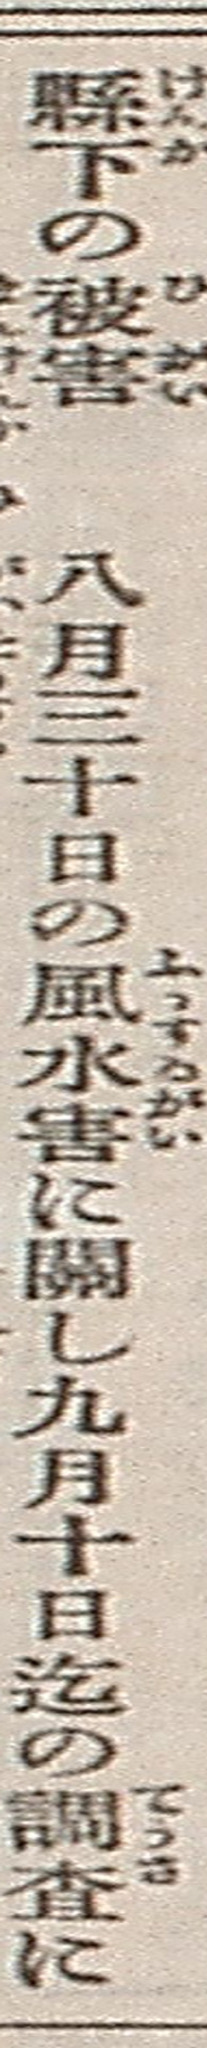県下の被害八月三十日の風水害に関し九月十日迄の調査に
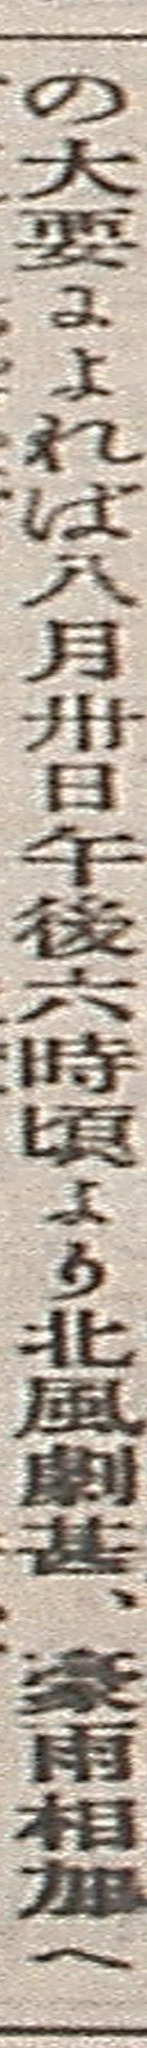の大要によれば八月卅日午後六時頃より北風劇甚、豪雨相加へ
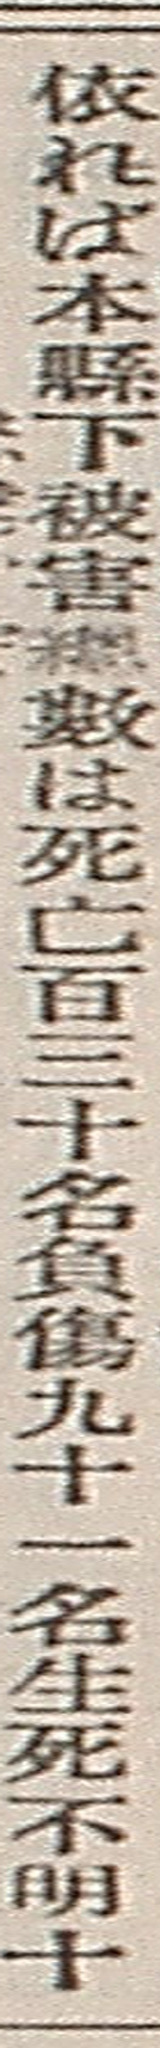依れば本県下被害総数は死亡百三十名負傷九十一名生死不明十
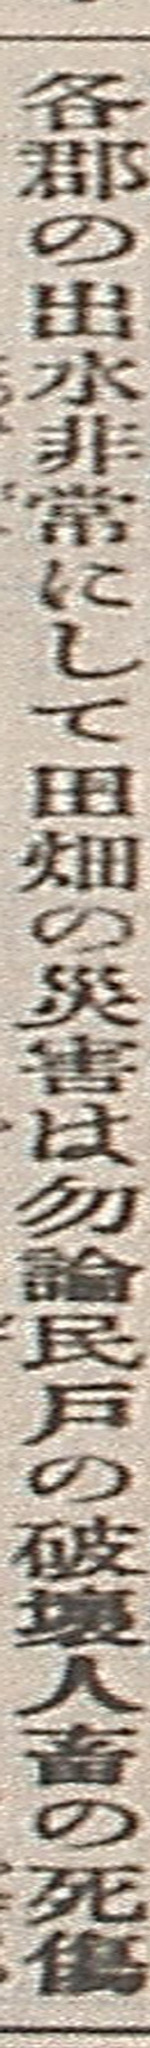各郡の出水非常にして田畑の災害は勿論民家の破壊人畜の死傷
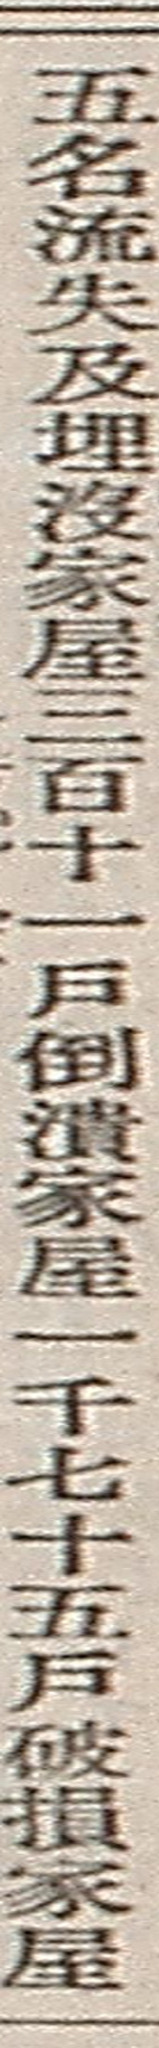五名流失及埋没家屋三百十一戸倒潰家屋一千七十五戸破損家屋
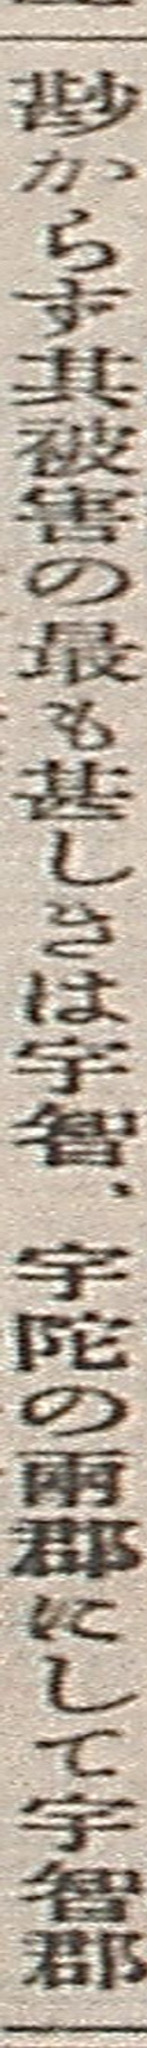尠からず其被害の最も甚しきは宇智、宇陀の両郡にして宇智郡
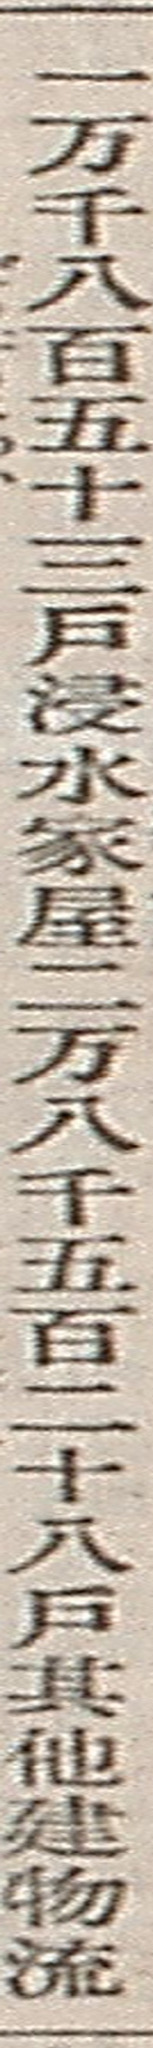一万千八百五十三戸浸水家屋二万八千五百二十八戸其他建物流
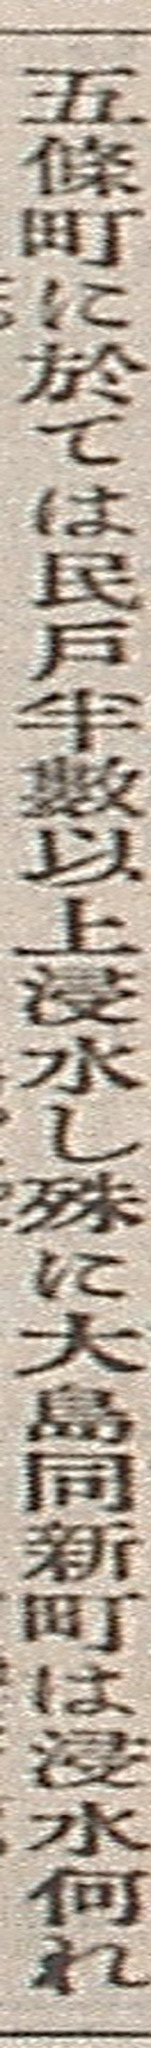五條町に於ては民戸半数以上浸水し殊に大島同新町は浸水何れ
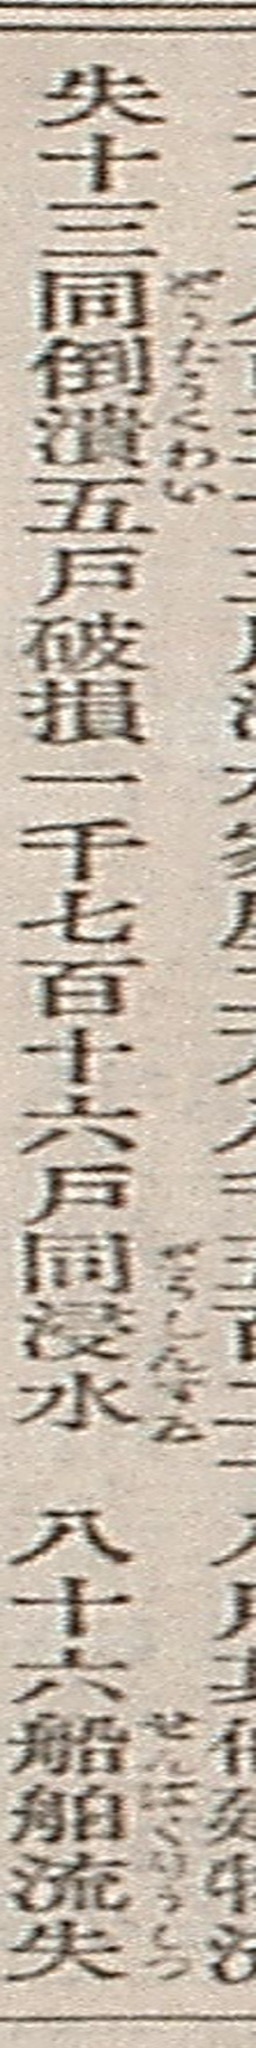失十三同倒潰五戸破損一千七百十六戸同浸水八十六船舶流失
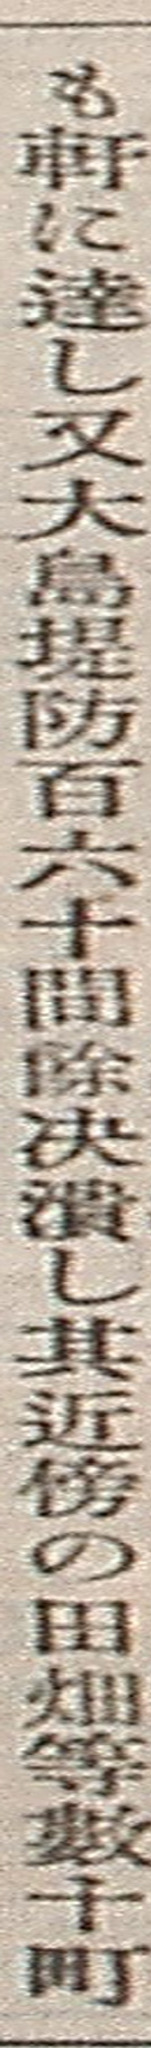も軒に達し又大島堤防百六十間餘决潰し其近傍の田畑等数十町

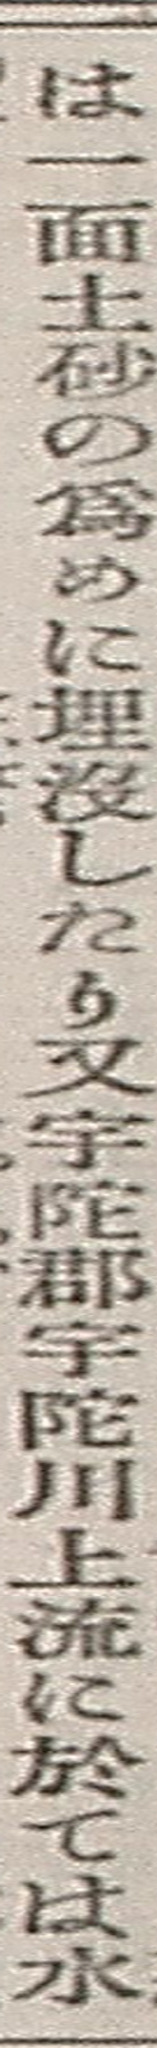は一面土砂の為めに埋没したり又宇陀郡宇陀川上流に於ては水
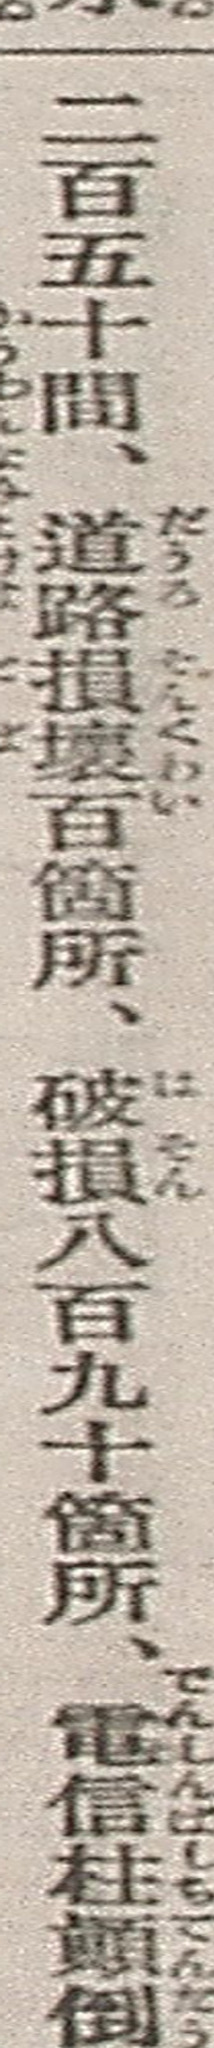二百五十間、道路損壊百箇所、破損八百九十箇所、電信柱顛倒
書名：風俗畫報臨時増刊第百二十八號　洪水被害録（下）
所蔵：東京大学地震研究所図書室 Earthquake Research Institute Library, The University of Tokyo, JAPAN
